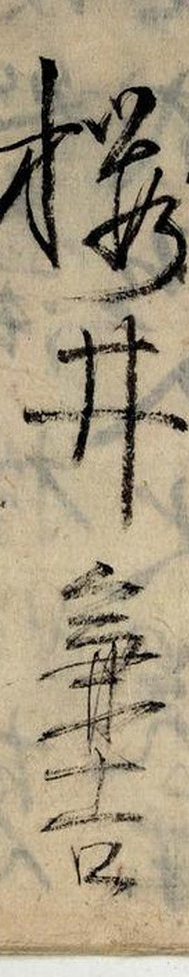桜井兼吉
